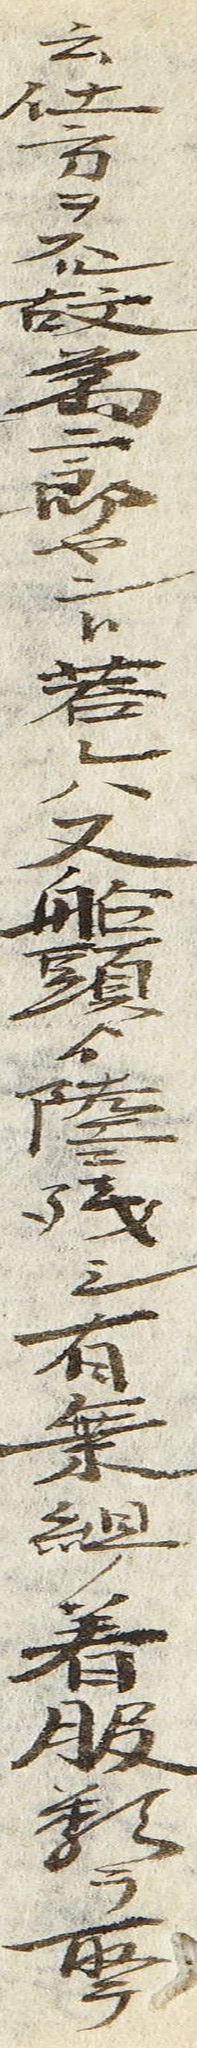云仕方ヲスル故萬二郎ヤント答レハ又船頭ゟ陸ニ残シ有乗組ノ着服類ヲ取テ
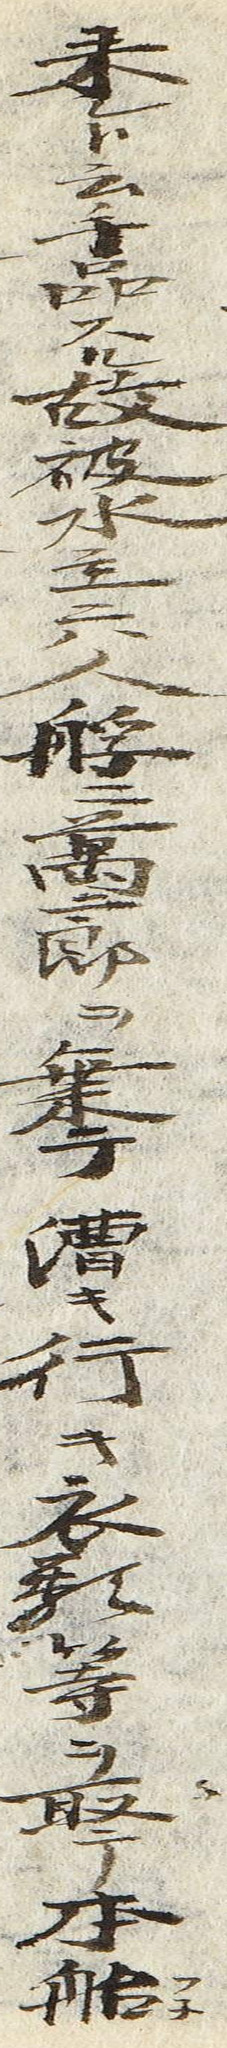来ント云手品スル故被水主六人艀ニ萬二郎ヲ乗テ漕キ行キ衣類等ヲ取テ本船
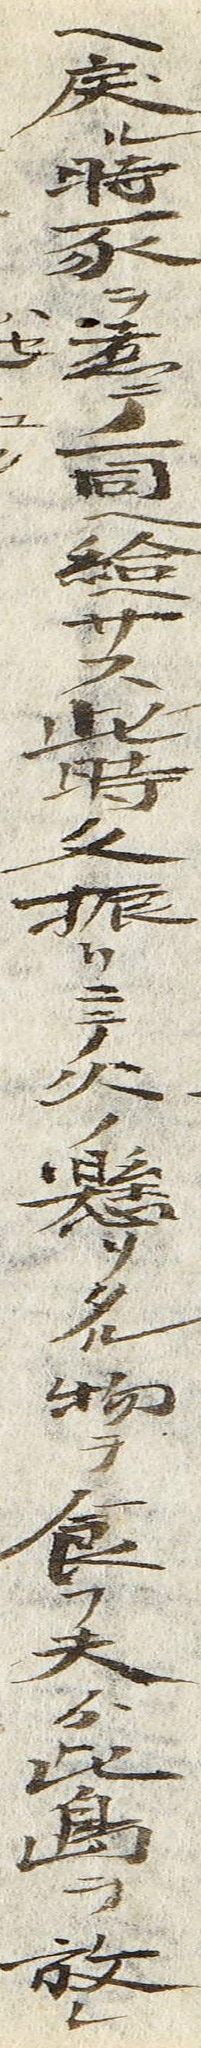ヘ戻ル時豕ヲ煮テ一同ヘ給ヘサス此時久振リニテ火ノ懸リタル物ヲ食フ夫ゟ此島ヲ放レ
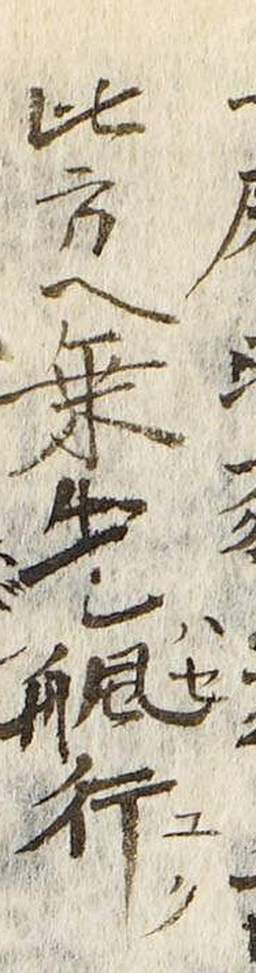北方へ乗出シ行
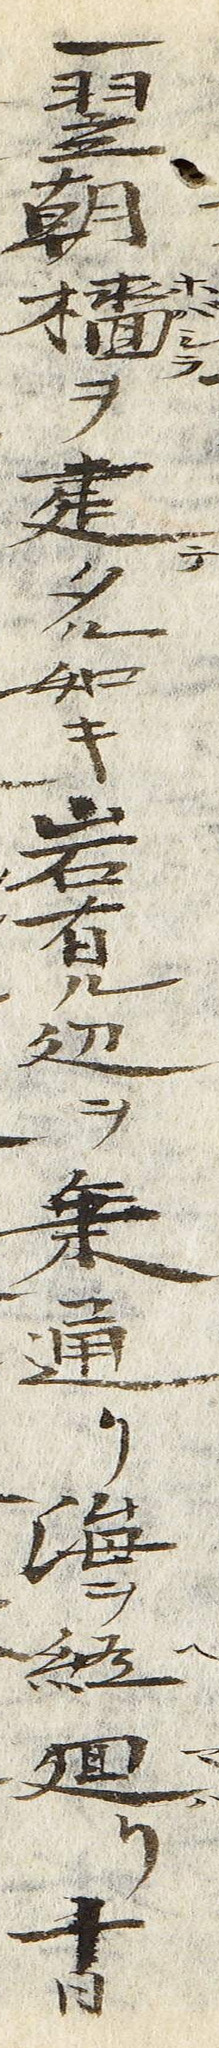一翌朝檣ヲ建テタル如キ岩有ル処ヲ乗通リ海ヲ経廻リ十日
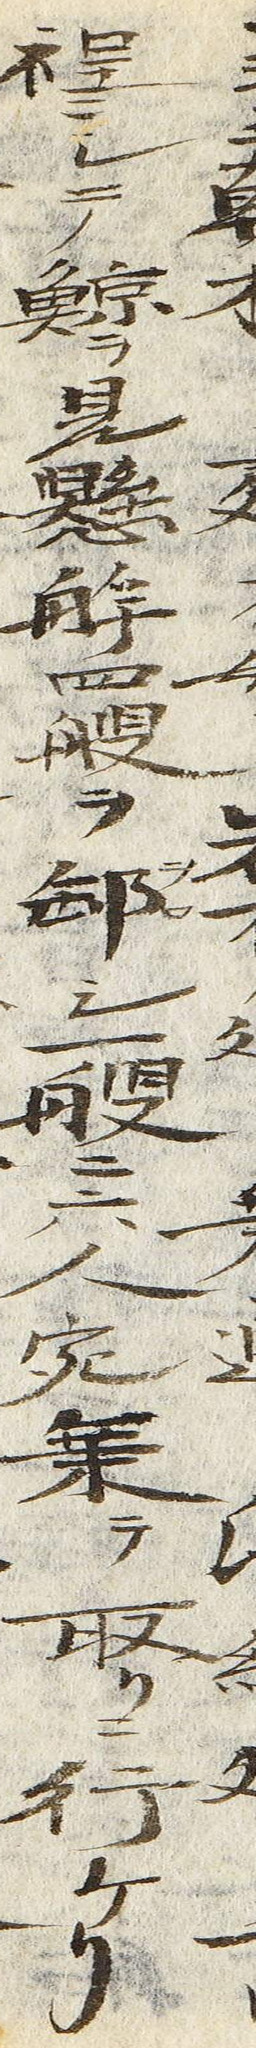程ニシテ鯨ヲ見懸艀四艘ヲ卸シ一艘ニ六人宛乗テ取リニ行ケリ
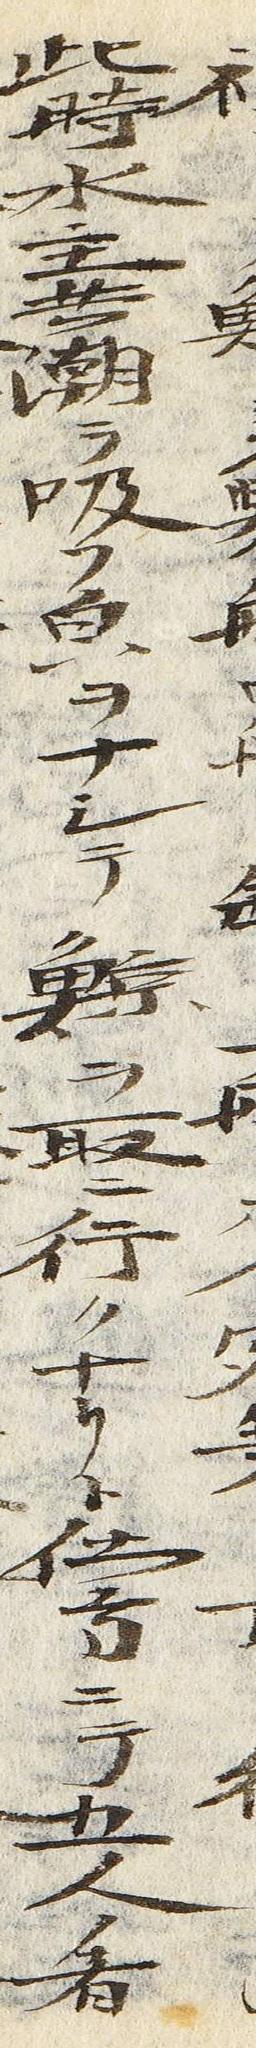此時水主共潮ヲ吸フ貌ヲナシテ鯨ヲ取ニ行クナリト仕方ニテ五人ノ者
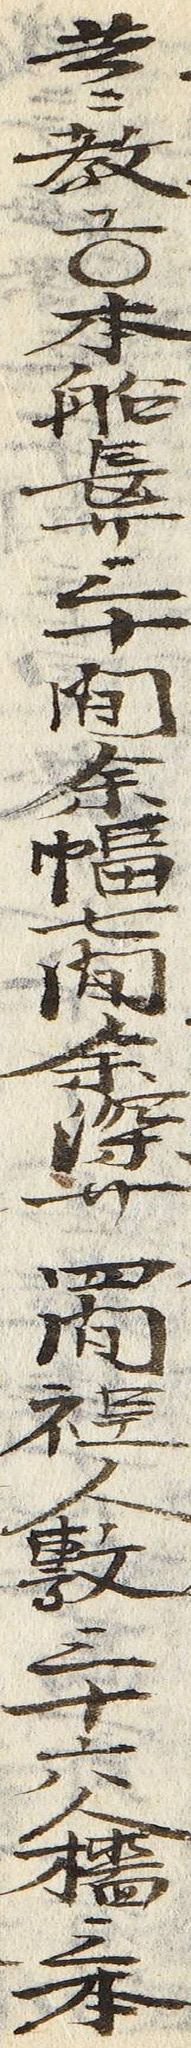共ニ教ユ〇本船長サ三十間余幅七間余深サ四間程人数三十六人檣三本
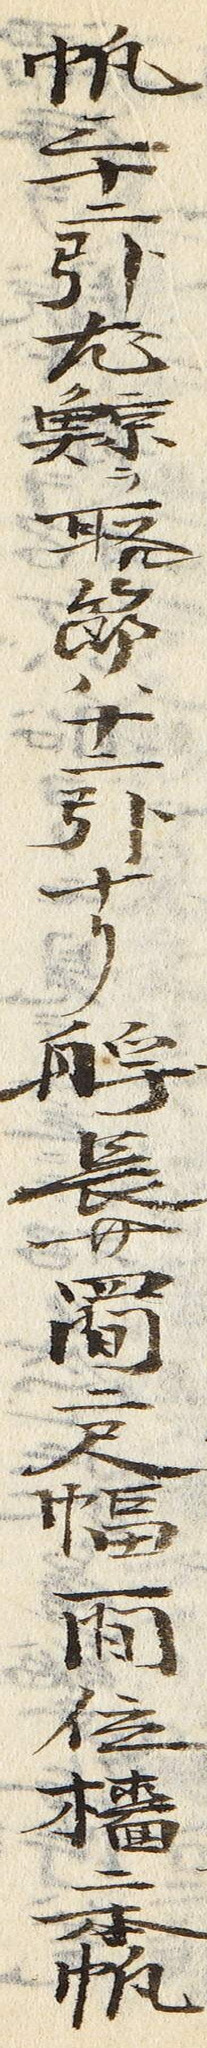帆三十二引尤鯨ヲ取ル節ハ十二引ナリ艀長サ四間二尺幅一間位檣二本帆
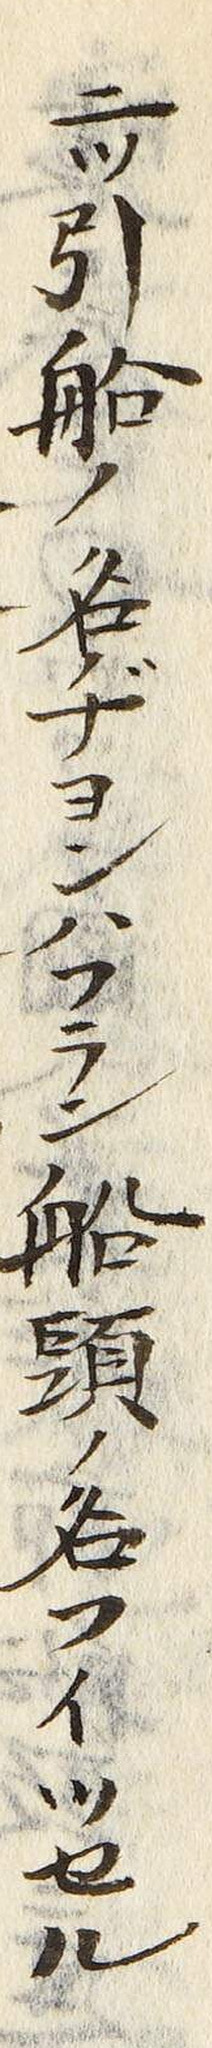二ツ引船ノ名ヂヨンハフラン船頭ノ名フイツセル
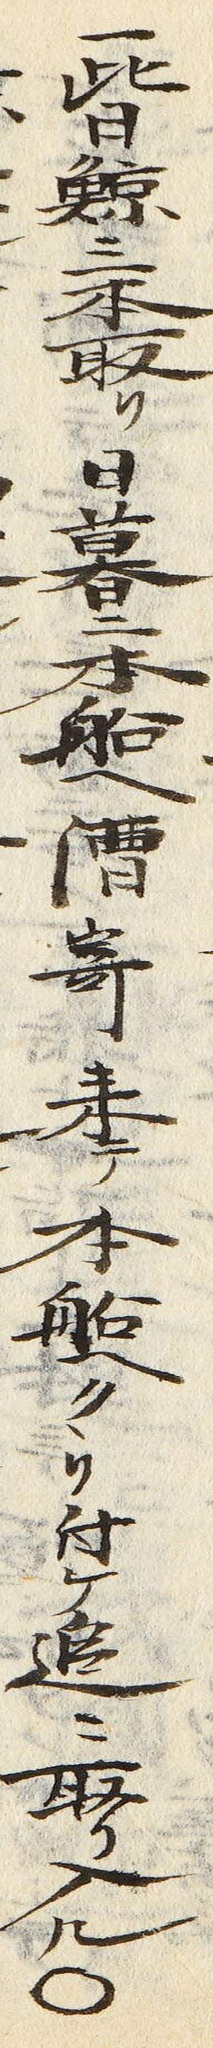一此日鯨三本取リ日暮二本船ヘ漕寄来テ本船ヘク丶リ付ケ追々取リ入ル〇
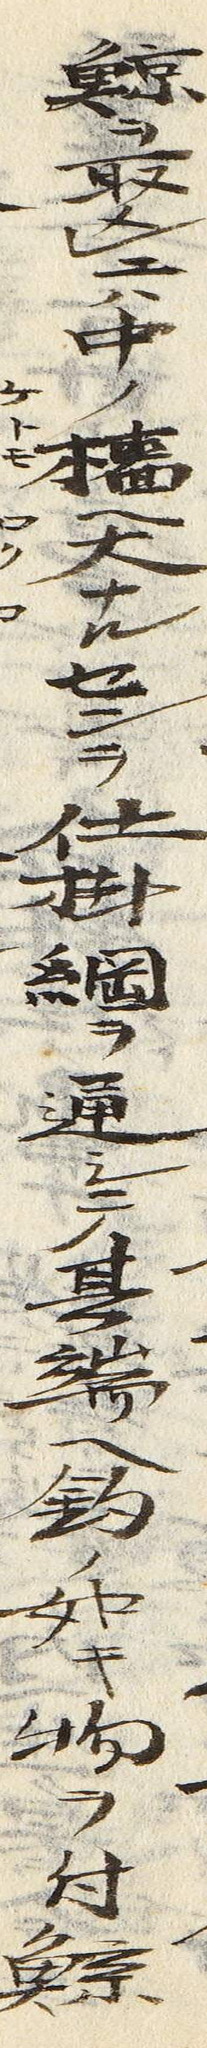鯨ヲ取込エハ中ノ檣ヘ大ナルセンヲ仕掛網ヲ通シテ其端へ釣ノ如キ物ヲ付鯨
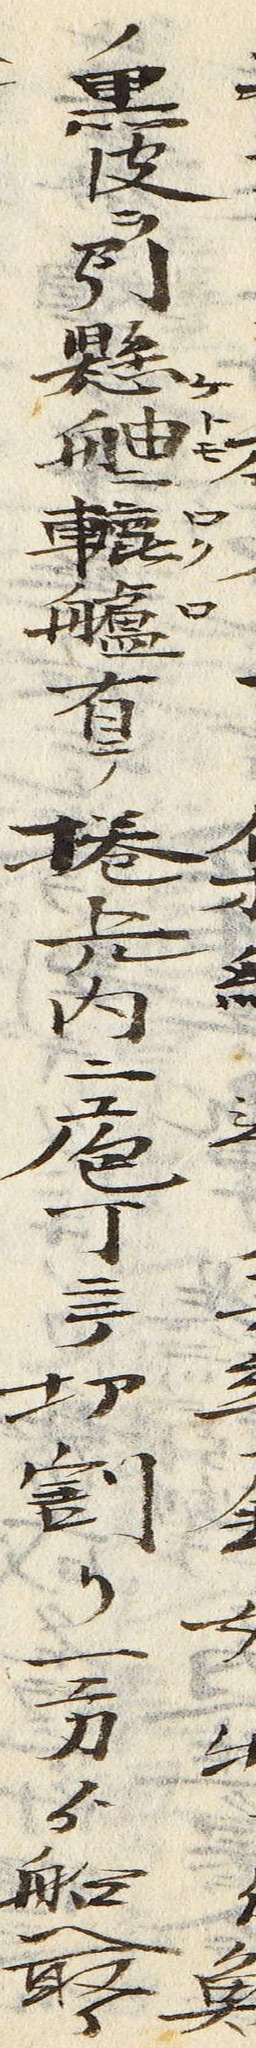ノ黒皮ヲ引懸ケ舳ニ轆轤有テ捲上ル内ニ包丁ニテ切割リ一方ゟ船ヘ取リ
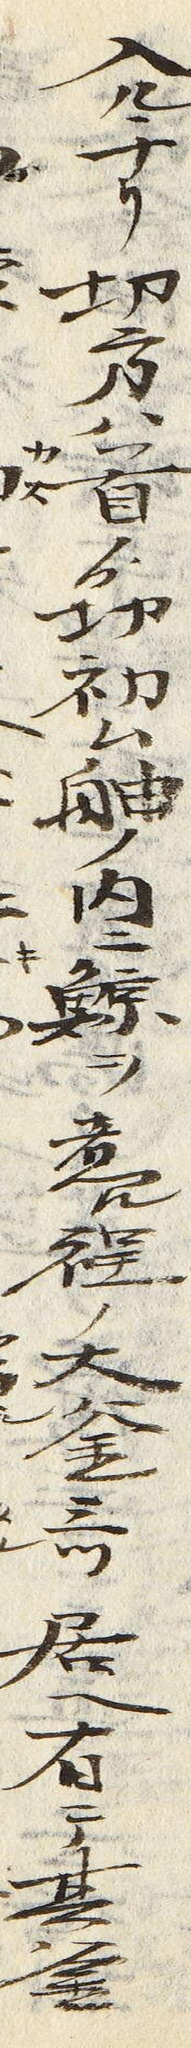入ルナリ切方ハ首ゟ切初ム舳ノ内ニ鯨ヲ煮ル程ノ大釜三ッ居ヘ有テ其釜
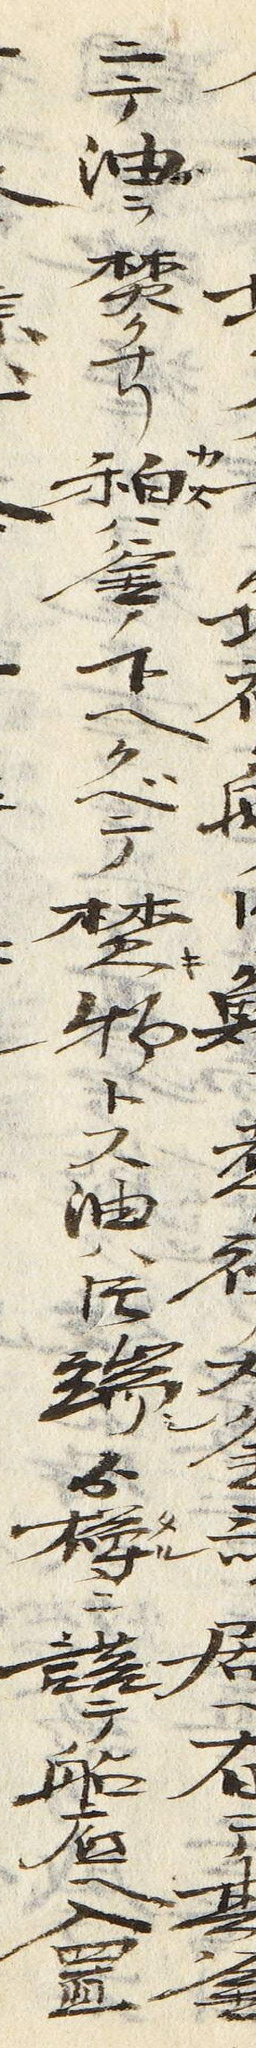ニテ油ヲ焚クナリ粕ハ釜ノ下ヘクベテ焚キ物トス油ハトモ端シゟ樽ニ詰テ船底ヘ入置
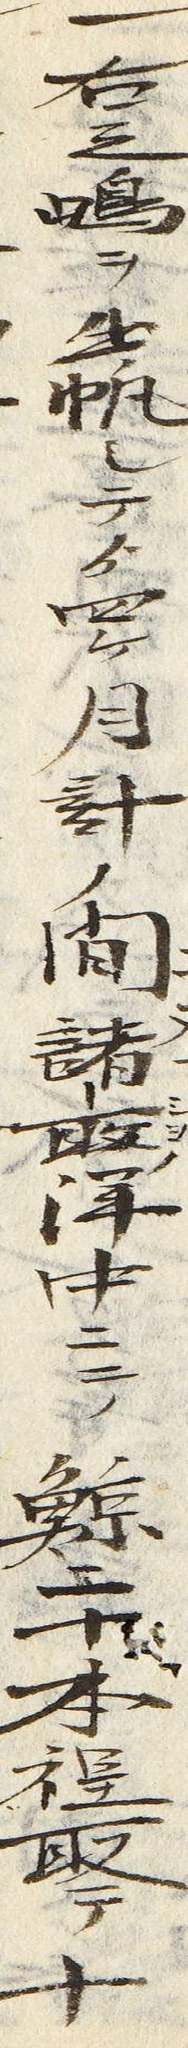一右之嶋ヲ出帆シテゟ四ヶ月計ノ間諸所ノ洋中ニテ鯨二十本程取テ十
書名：漂流記聞
